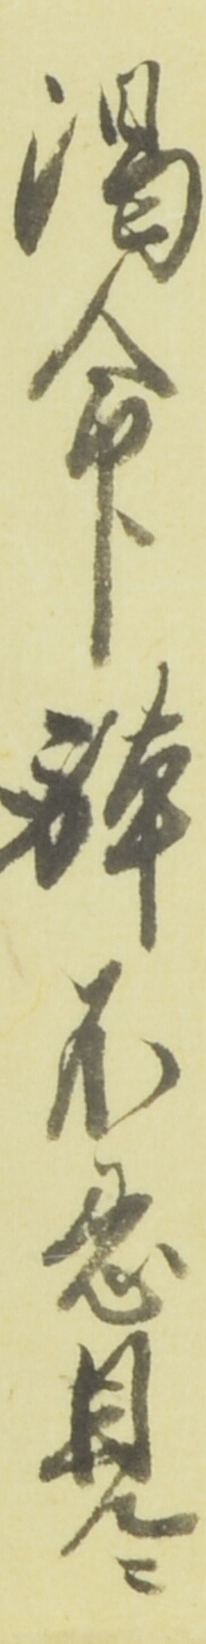渇命体不忍見ニ
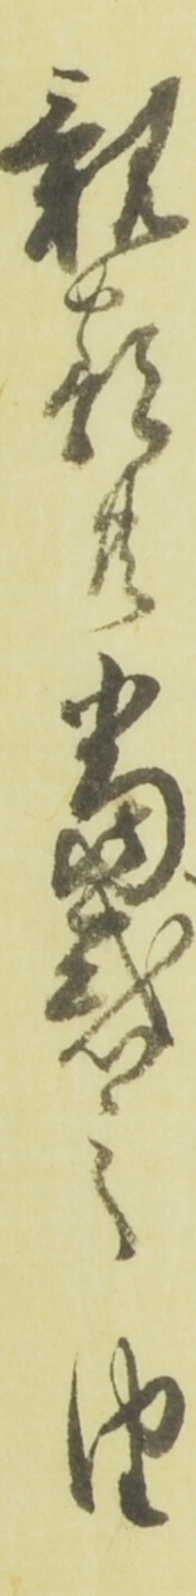親類共当惑之由
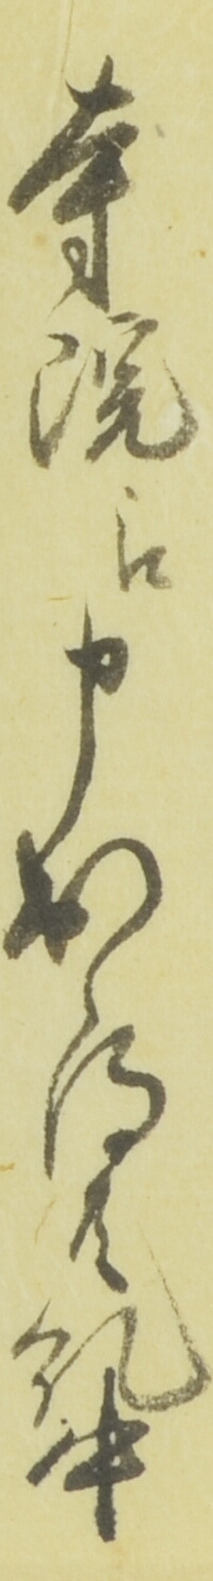寺院江申出候得共糺中
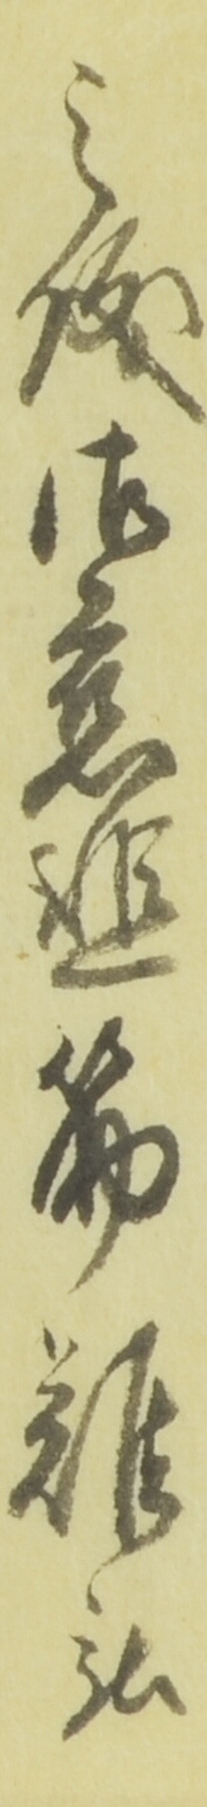之儀御慈悲筋難被
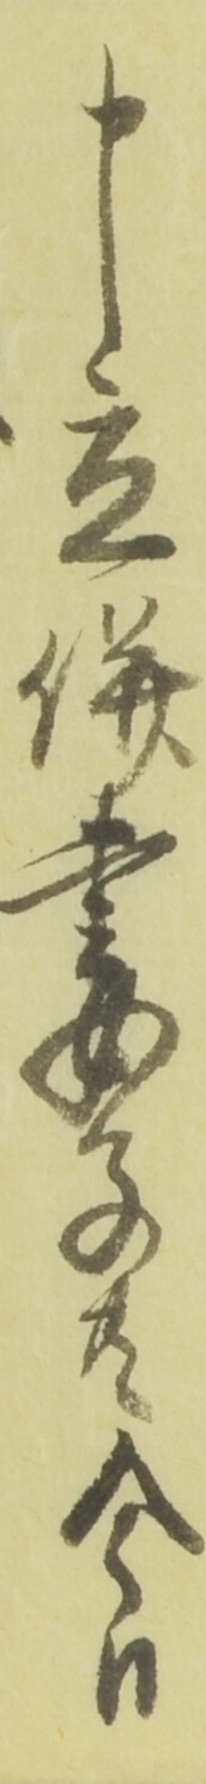申立併妻子共今日
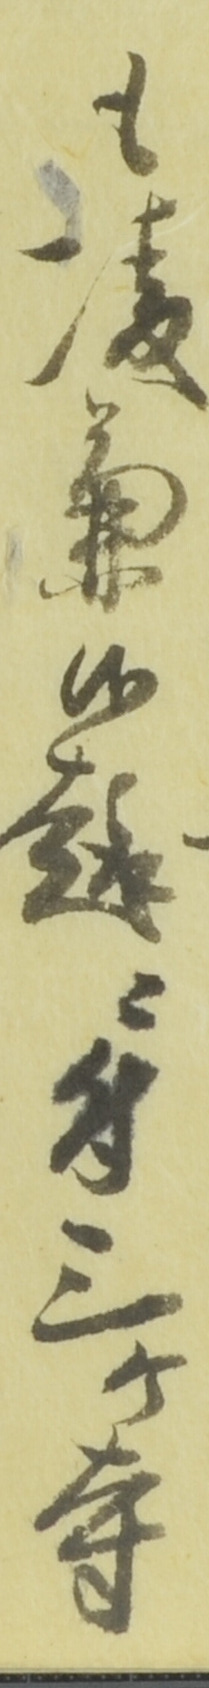も凌兼候趣ニ付三ヶ寺
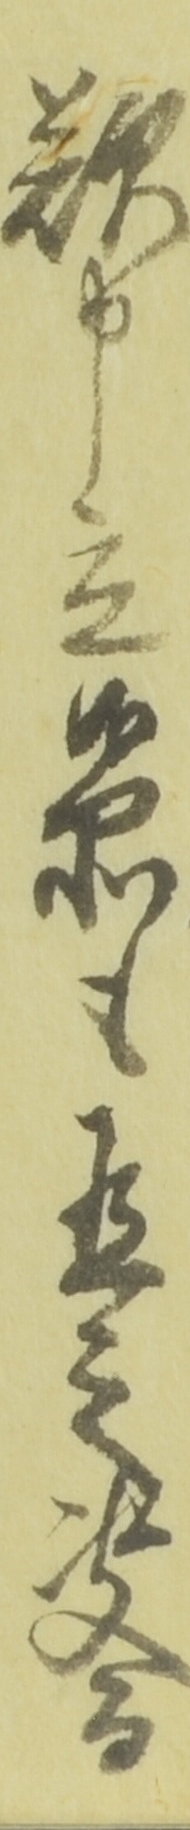嘆申立候品も有之決而
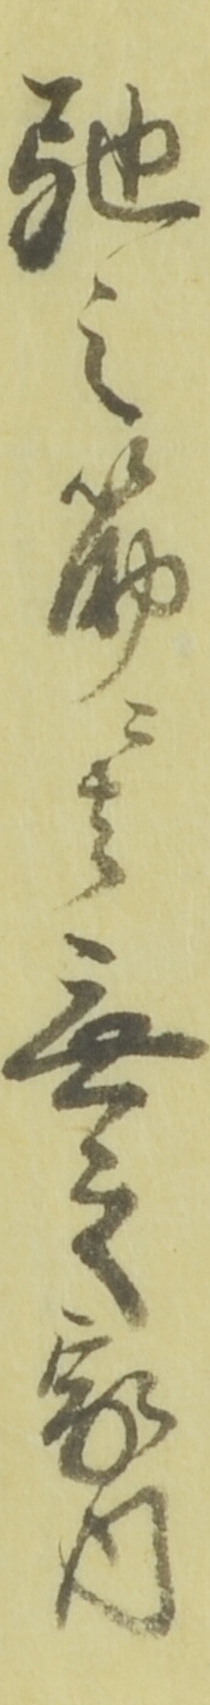弛之筋ニは無之家内
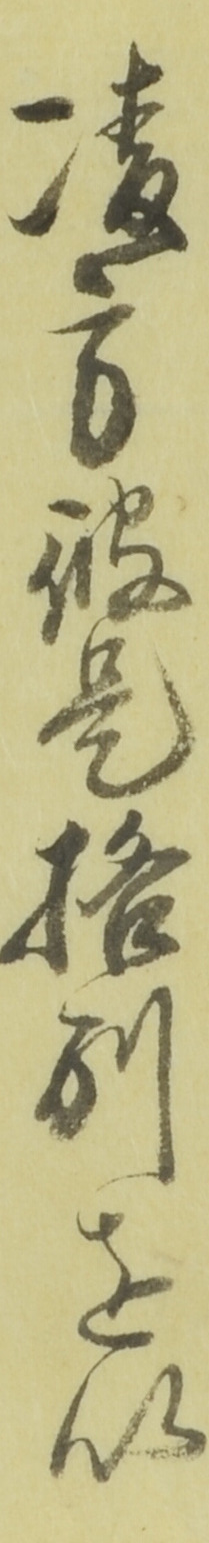凌方彼是格別を以
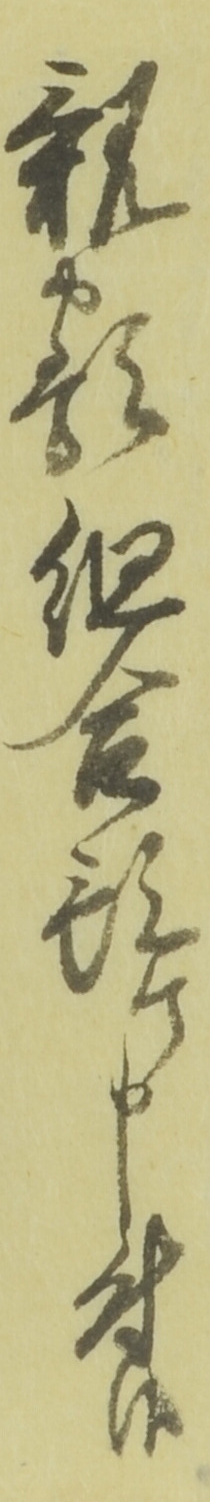親類組合預ヶ申付候
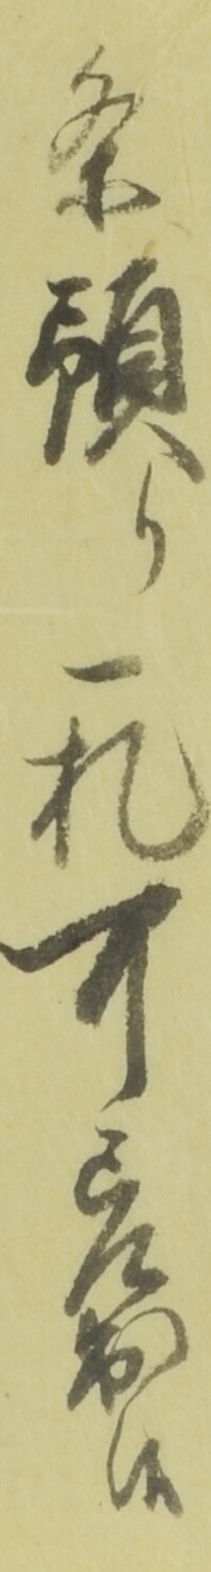条預り一札可差出候
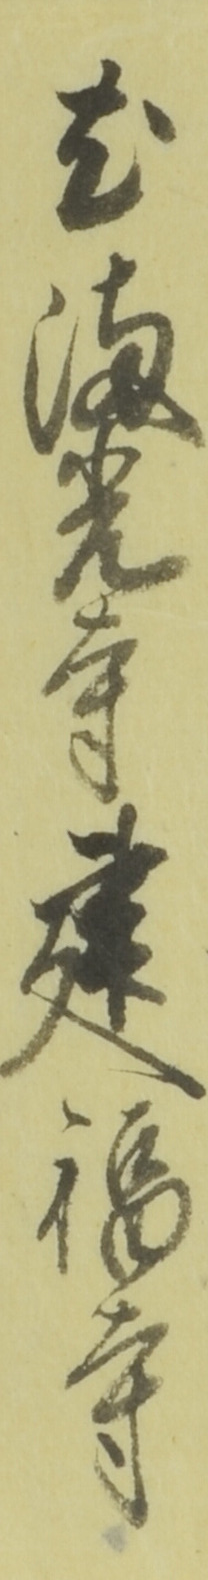尤満光寺建福寺
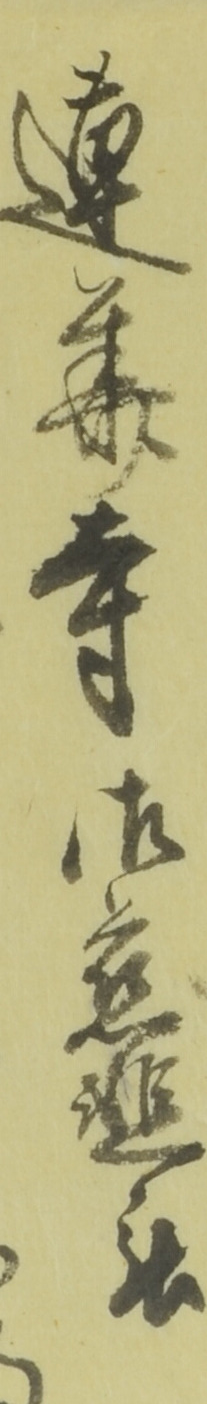蓮華寺御慈悲被
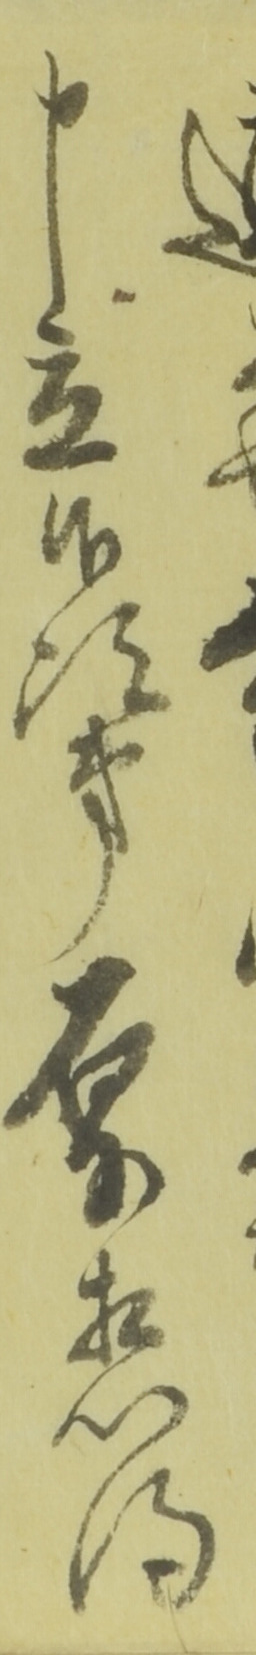申立候次第厚相心得
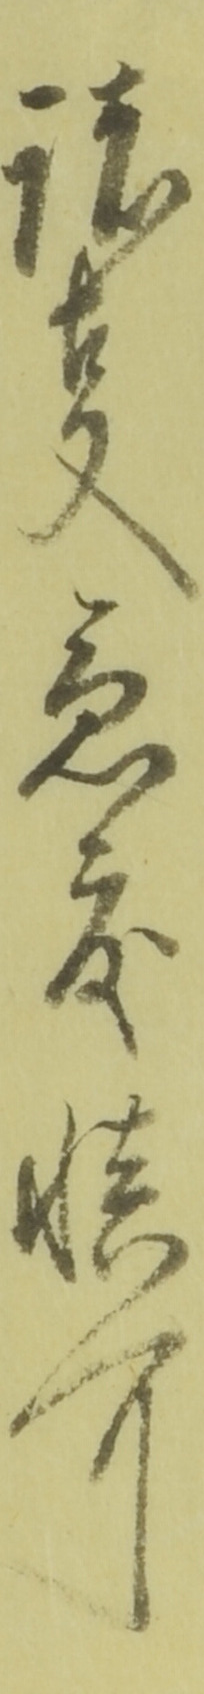諸事急度慎可
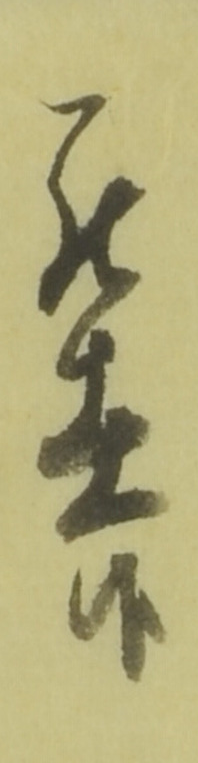罷在候
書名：御触書御書附控
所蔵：伊那市立高遠町図書館・合同会社AMANE
